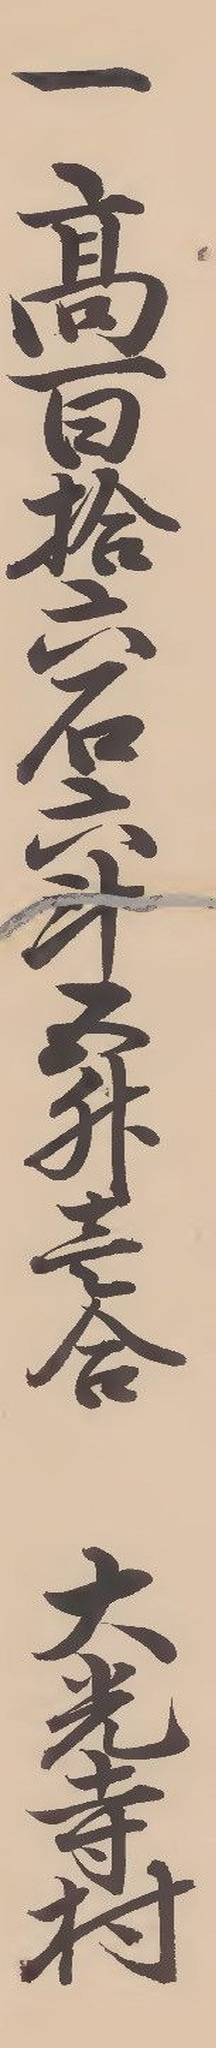一高百拾六石六斗五升壱合大光寺村
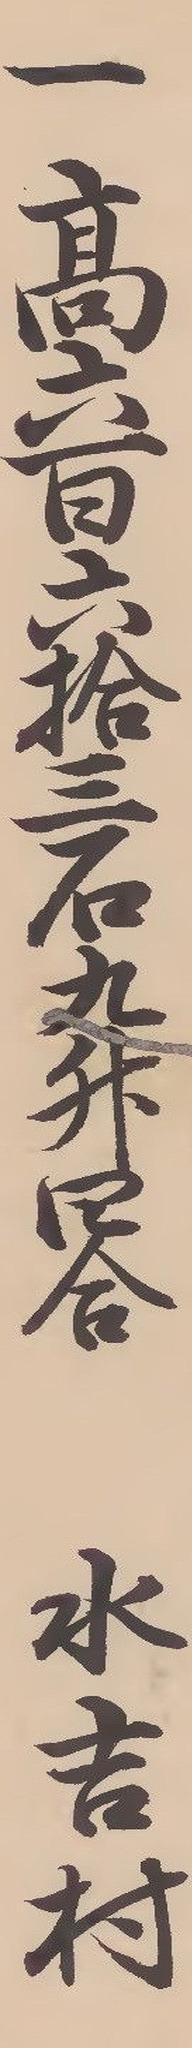一高六百六拾三石九升四合水吉村

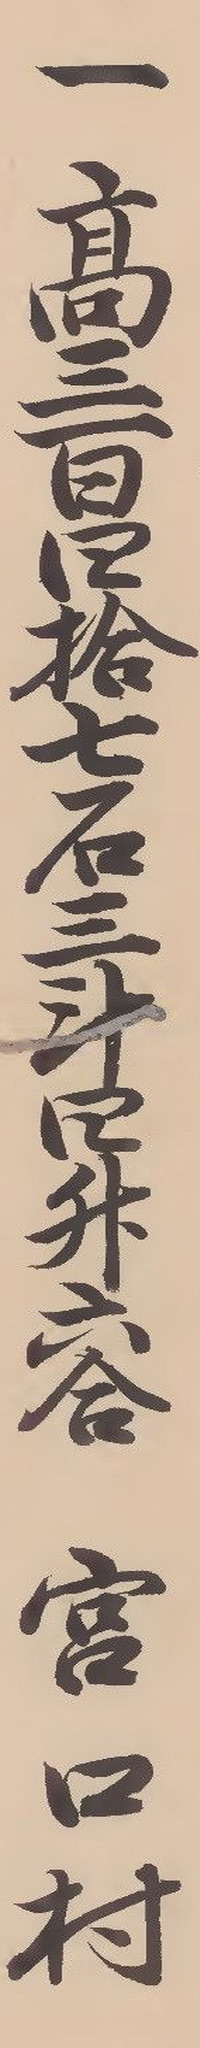一高三百四拾七石三斗四升六合宮口村
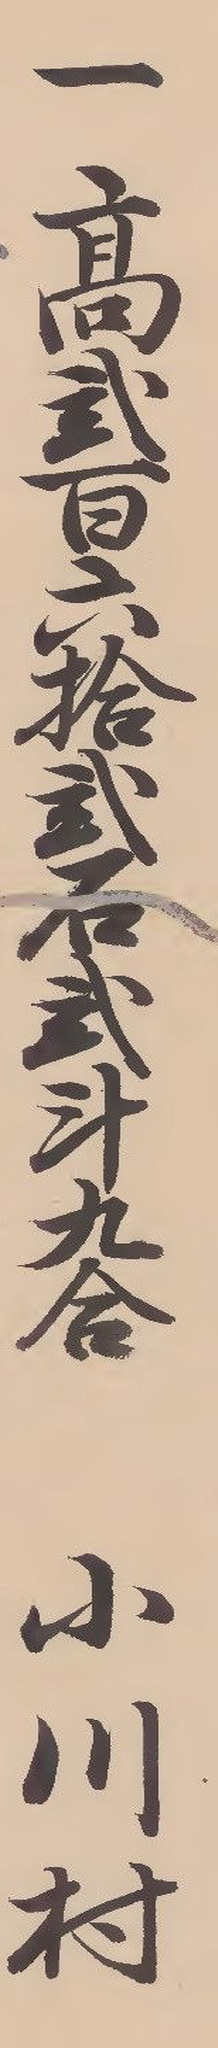一高弐百六拾弐石弐斗九合小川村
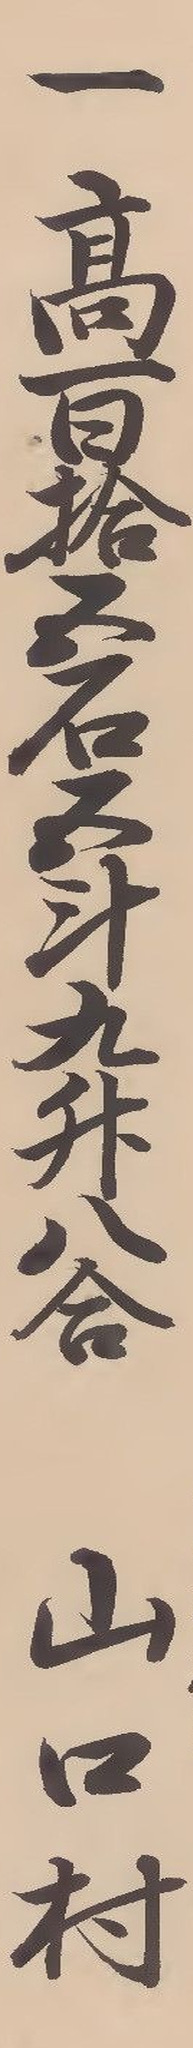一高百拾五石五斗九升八合山口村
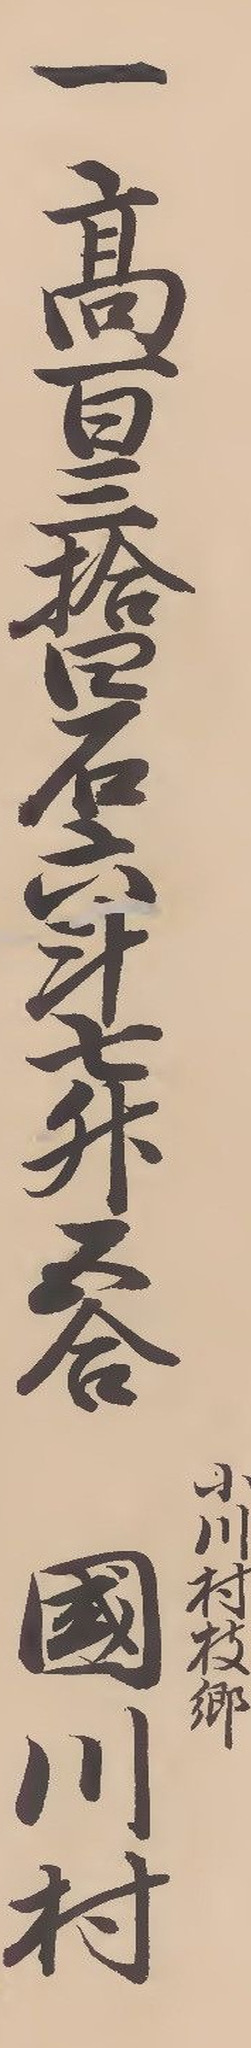一高百三拾四石六斗七升五合国川村
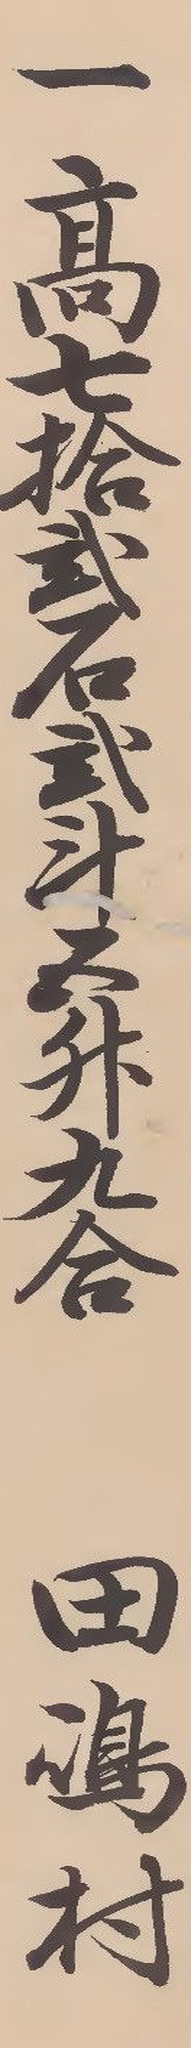一高七拾弐石弐斗五升九合田島村
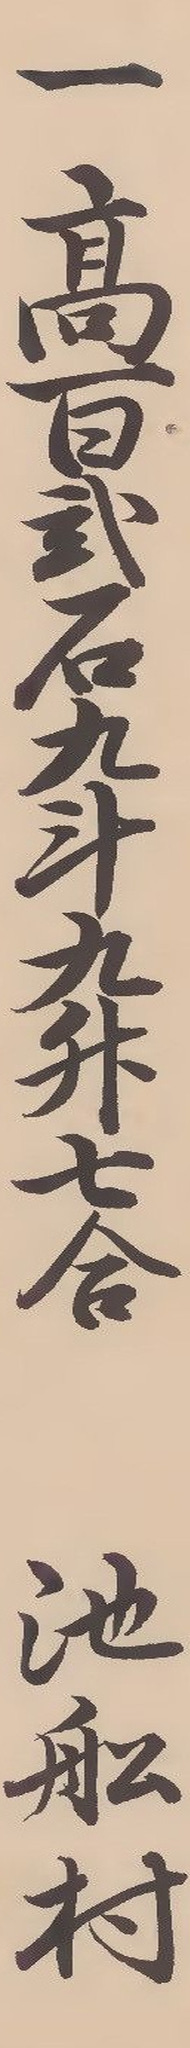一高百弐石九斗九升七合池船村
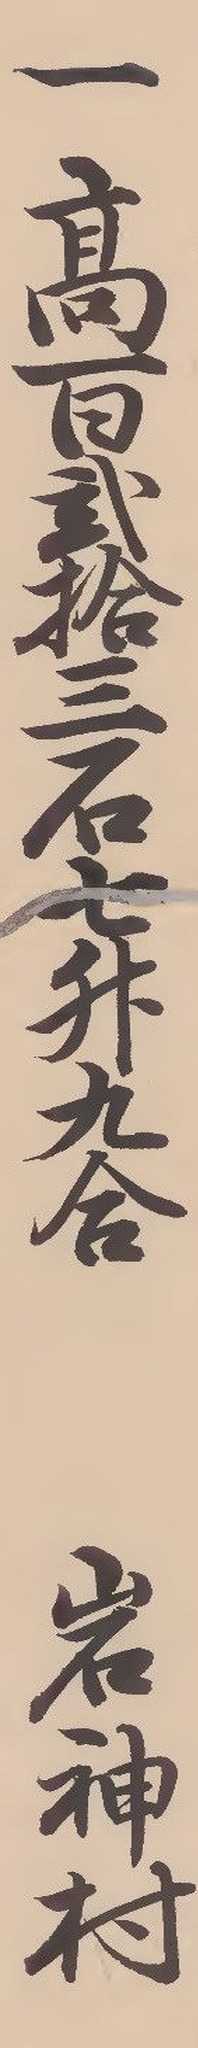一高百弐拾三石七升九合岩神村
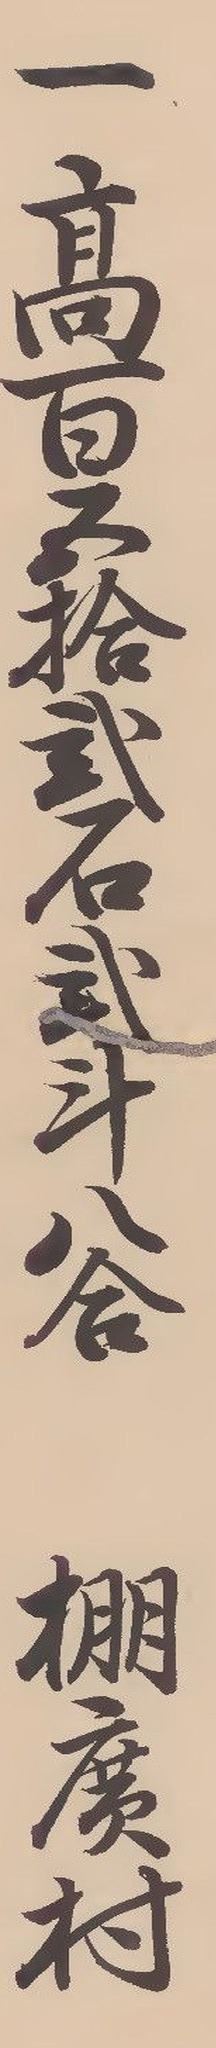一高百五拾弐石弐斗八合棚広村

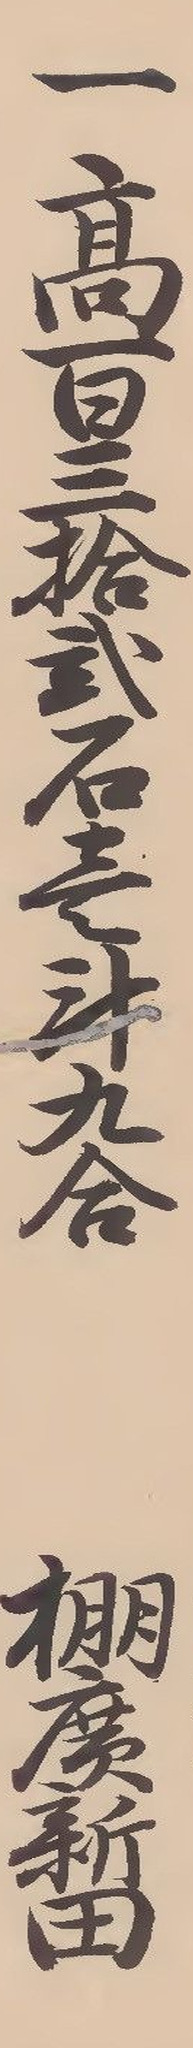一高百三拾弐石壱斗九合棚広新田
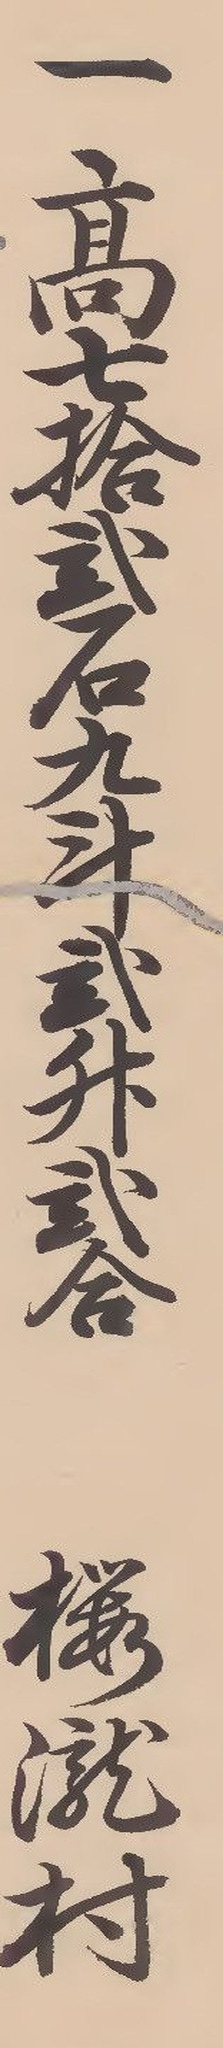一高七拾弐石九斗弐升弐合桜滝村
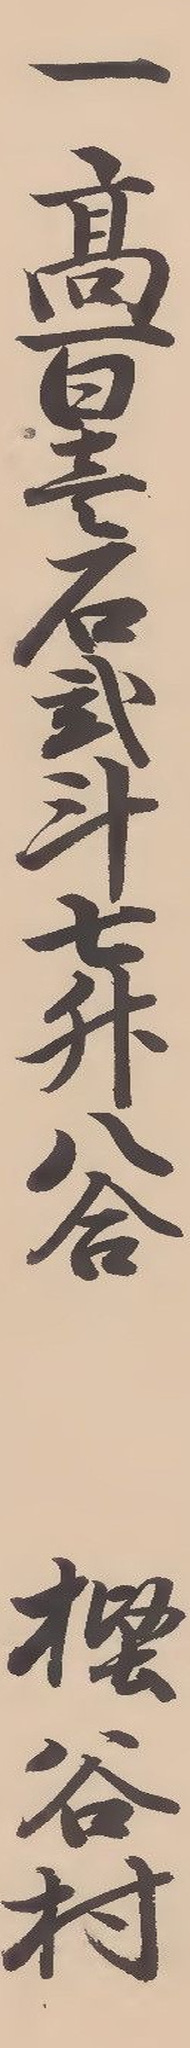一高百壱石弐斗七升八合樫谷村
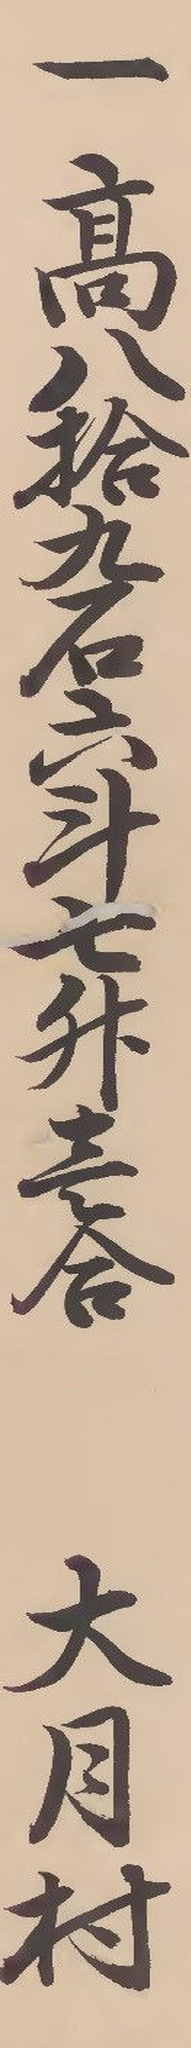一高八拾九石六斗七升壱合大月村
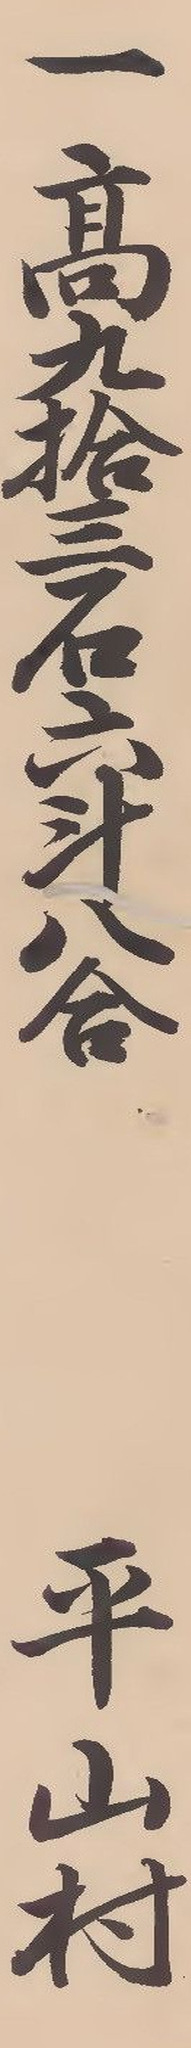一高九拾三石六斗八合平山村
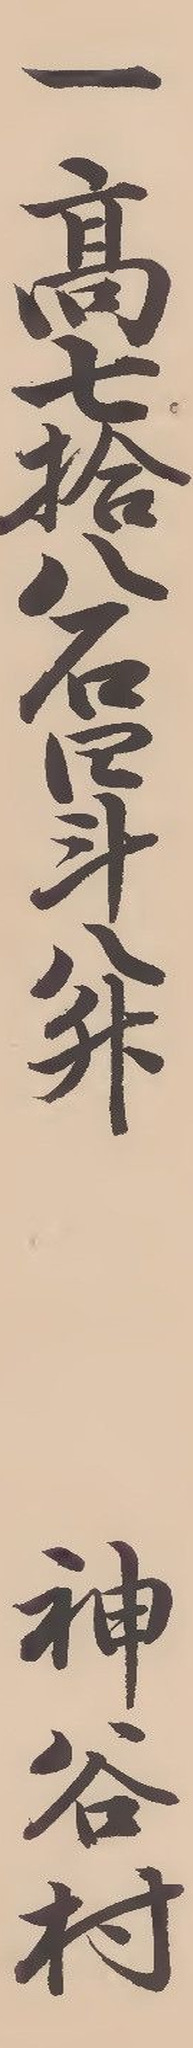一高七拾八石四斗八升神谷村
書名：越後国郷帳　上
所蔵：国立公文書館 National Archives of Japan
